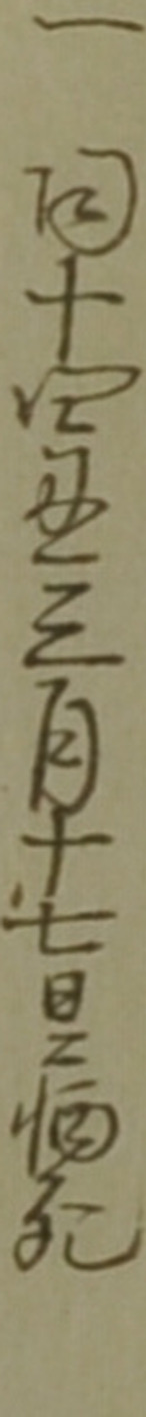一同十四丑三月十七日病死
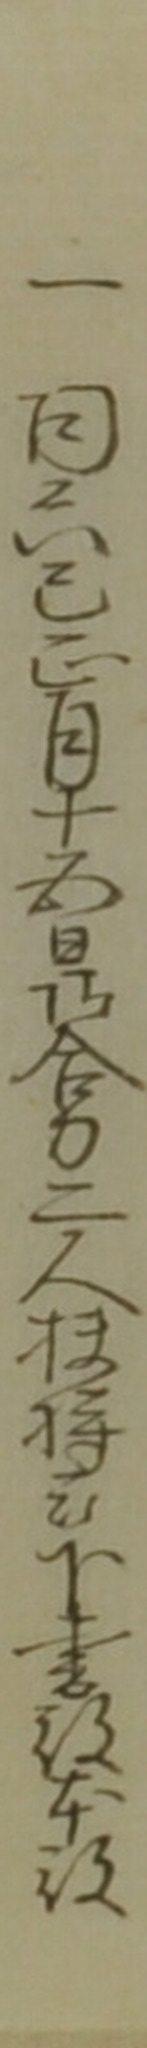一同六巳正月十五日御合力二人扶持被下書役本役
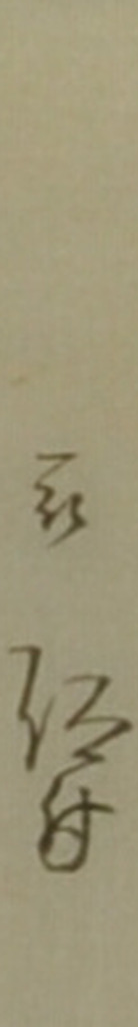被仰付
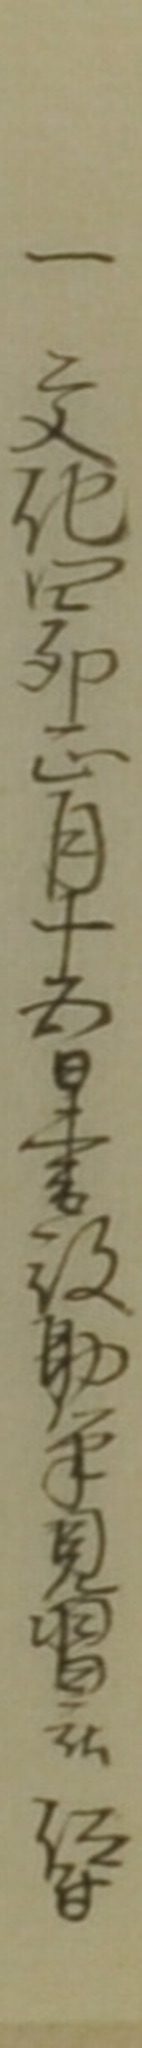一文化四卯正月十五日書役助筆見習被仰付
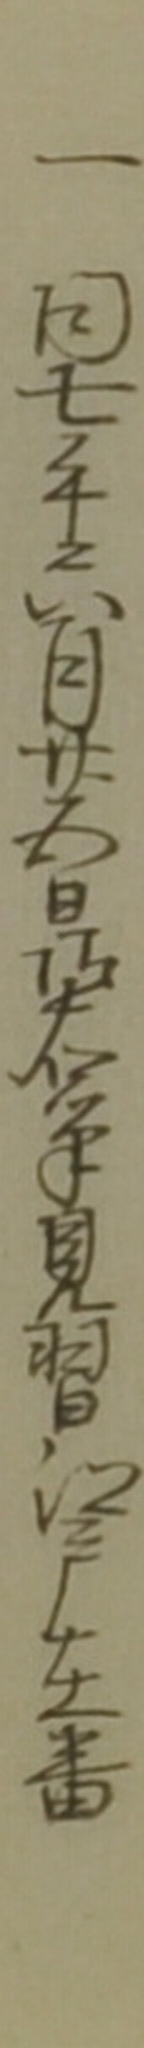一同七午六月廿五日御右筆見習江戸在番
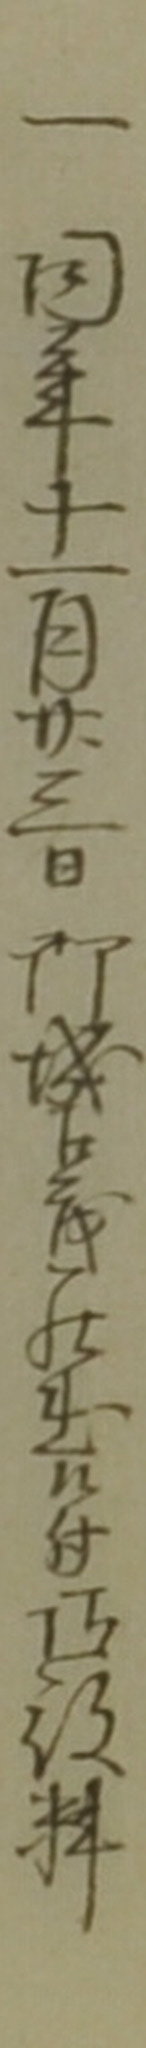一同年十一月廿三日御城江茂罷出候付御役料
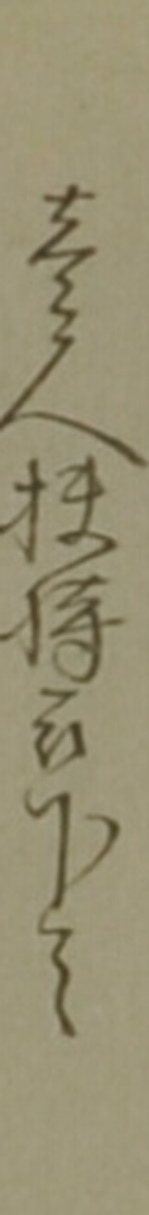壱人扶持被下之
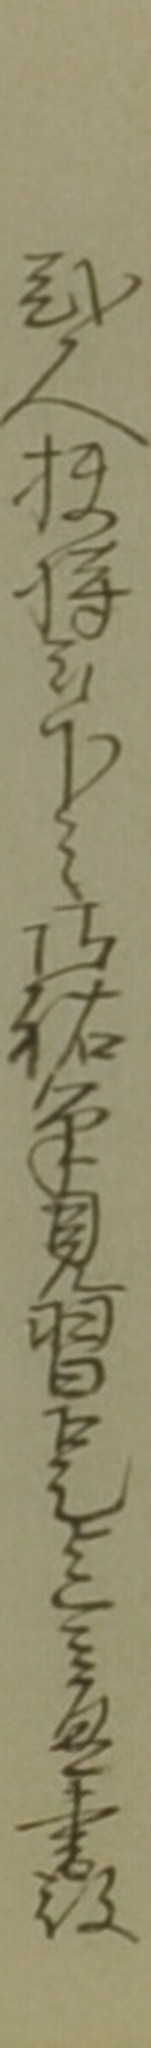弐人扶持被下之御祐筆見習是迄之通書役
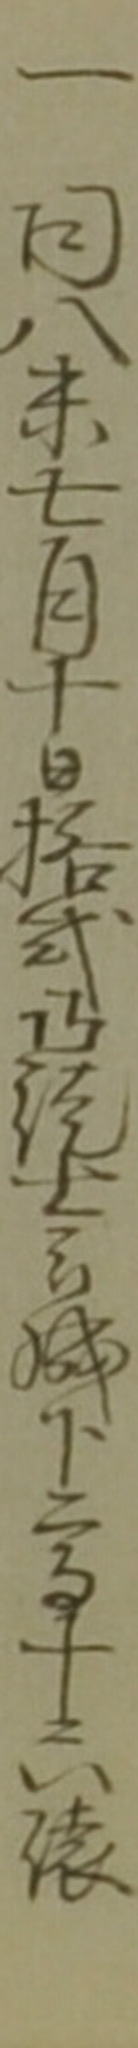一同八未七月十日格式御徒士被成下高十六俵
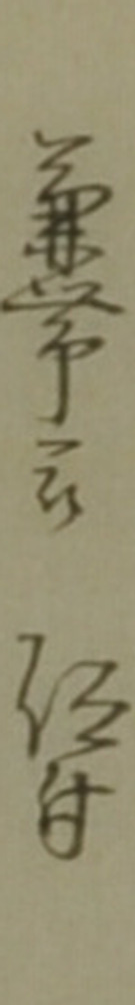兼帯被仰付
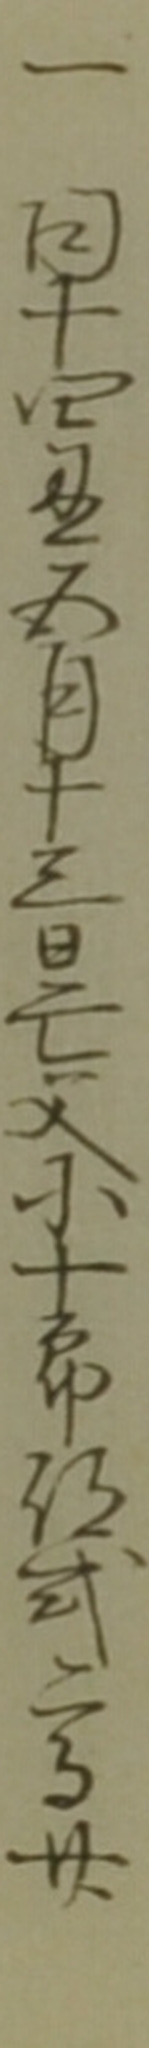一同十四丑五月十三日亡父小十郎跡式高廿
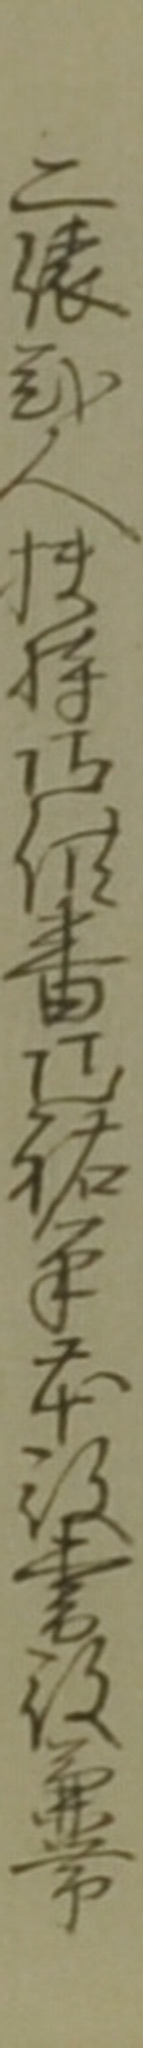二俵弐人扶持御供番御祐筆本役書役兼帯
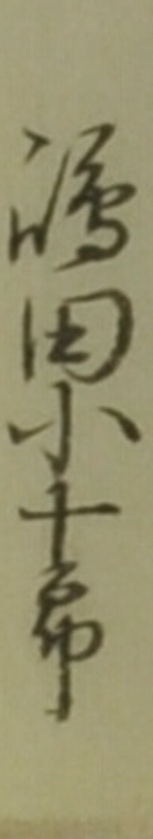嶋田小十郎

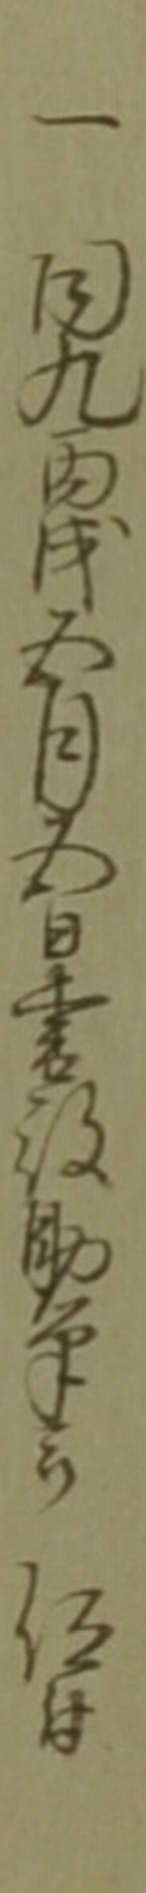一同九丙戌五月五日書役助筆被仰付
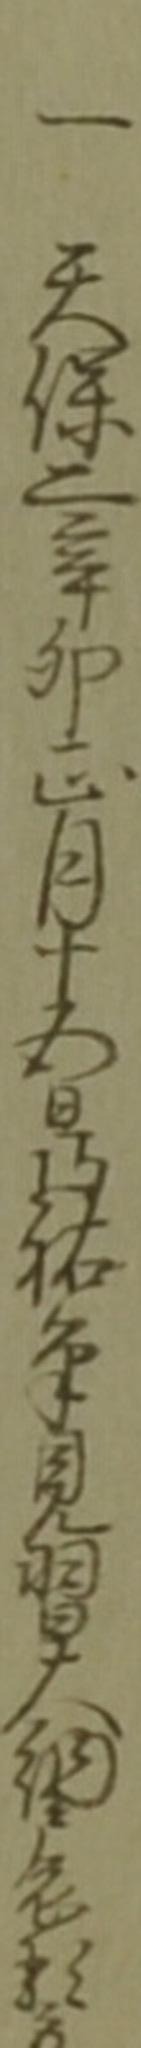一天保二辛卯正月十五日御祐筆見習大納戸衣類方
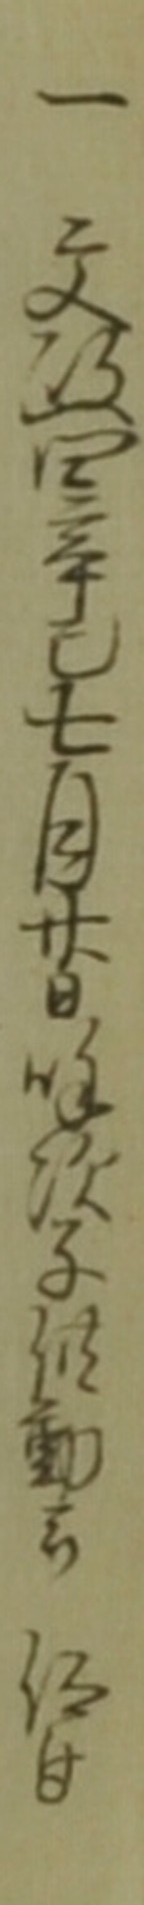一文政市四辛巳七月廿日呼次子供勤被仰付
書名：無足諸士勤仕録（五）
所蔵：伊那市立高遠町図書館・合同会社AMANE
